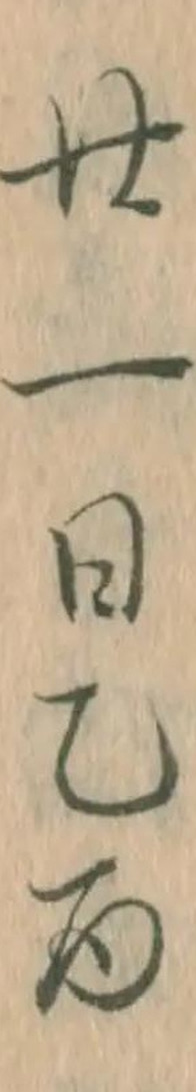廿一日乙酉
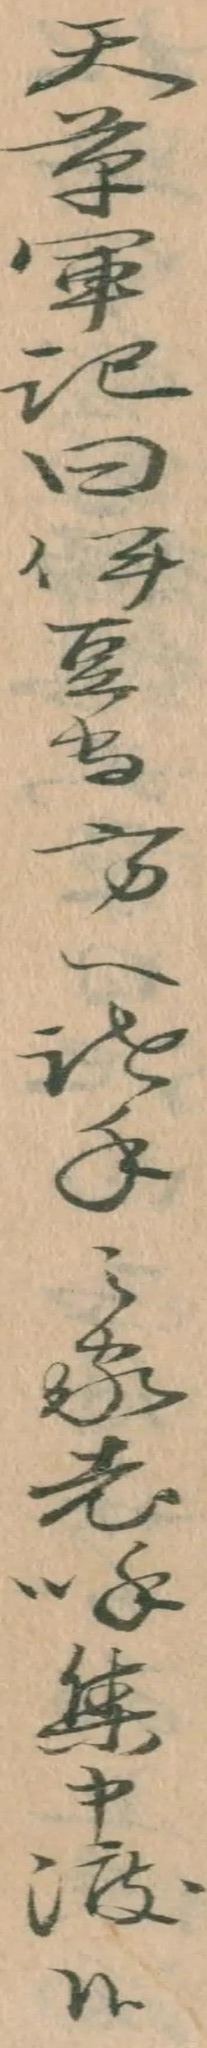天草軍記曰伊豆守方へ諸手之家老呼集申渡候
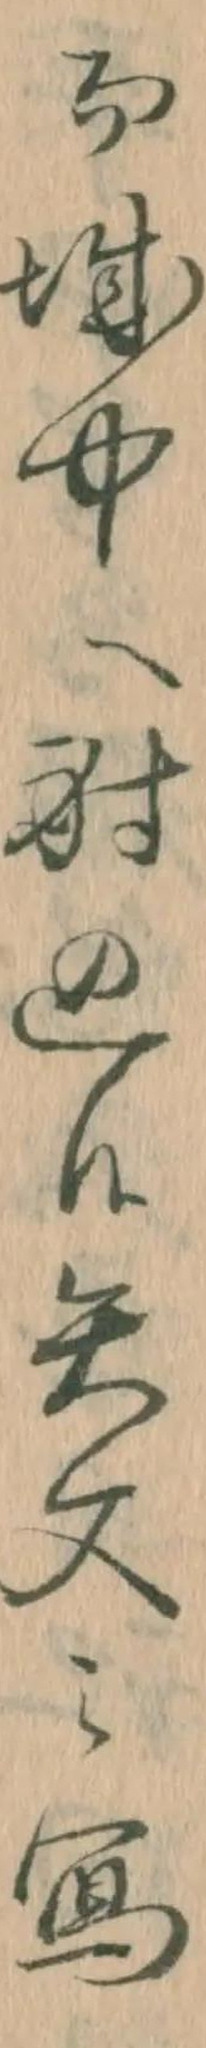而城中へ射込候矢文に写
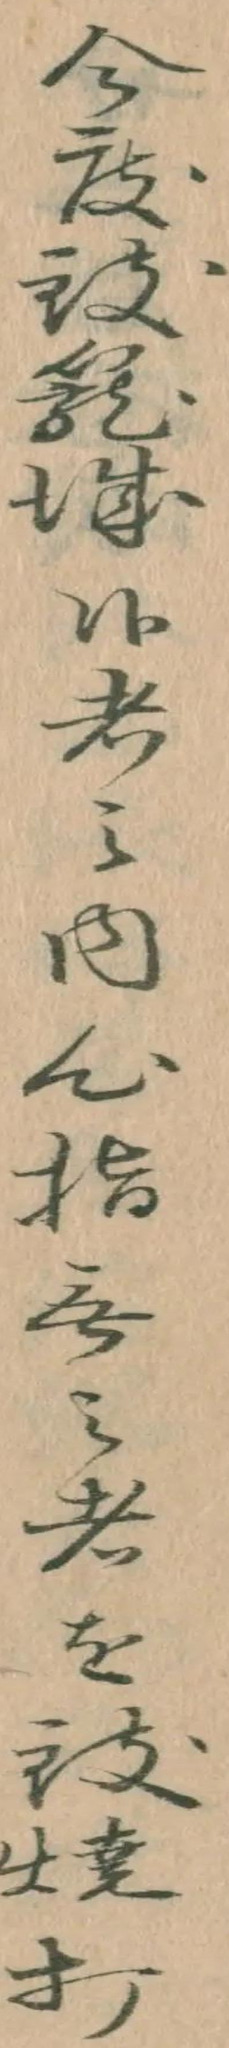今度致籠城候者之内心指無之者を致焼打
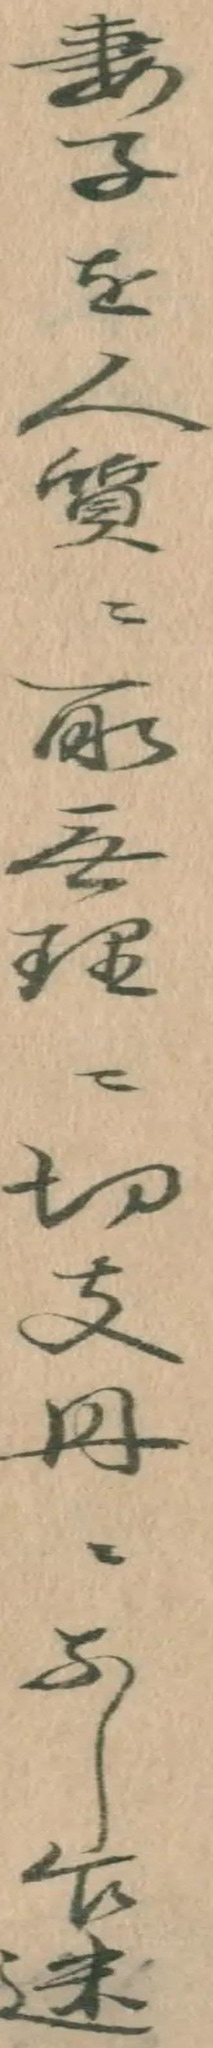妻子を人質に取無理に切支丹になし乍迷
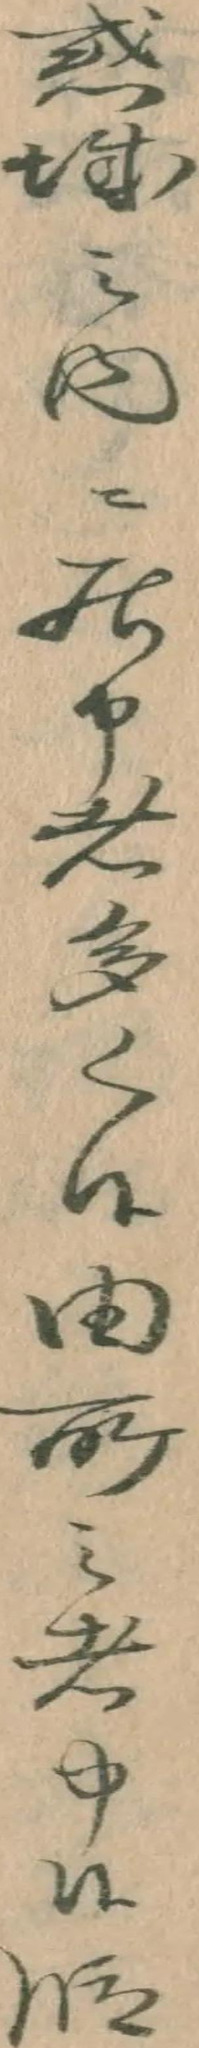惑城之内に居申者多く候由所之者申候段
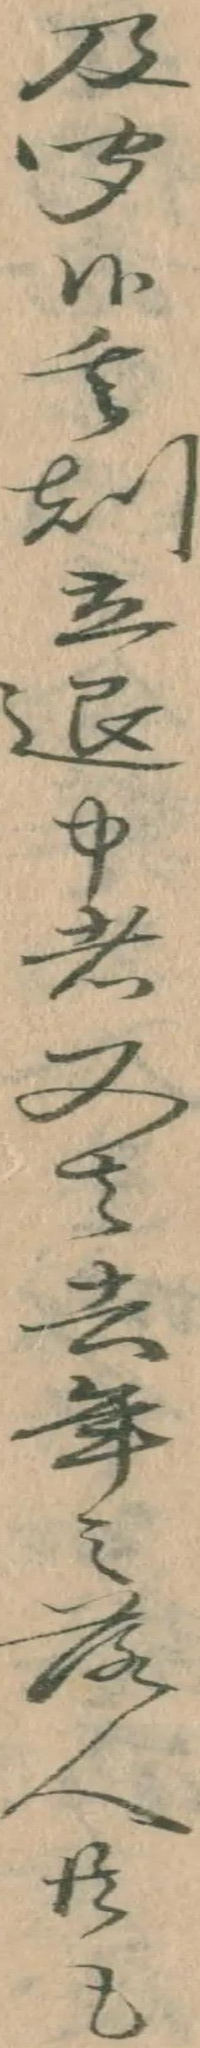及聞候其刻立退申者又者去年之落人共も
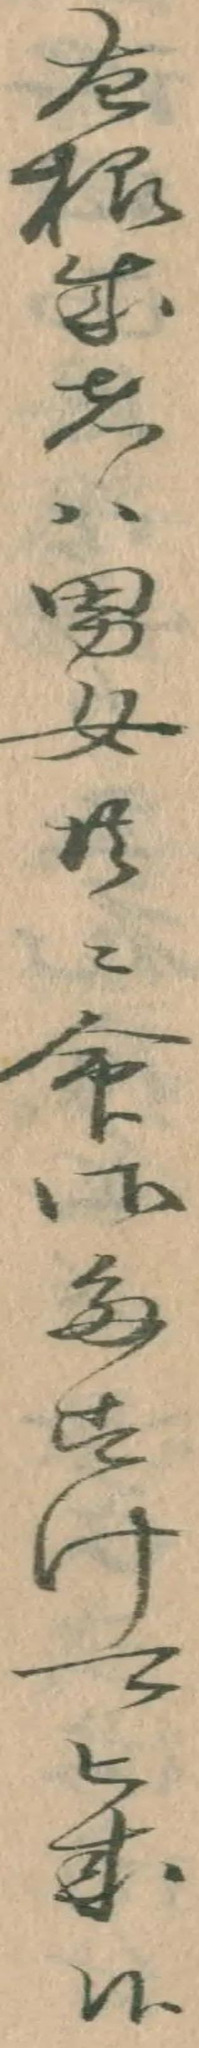左様成者は男女共に命御多春け可被成候
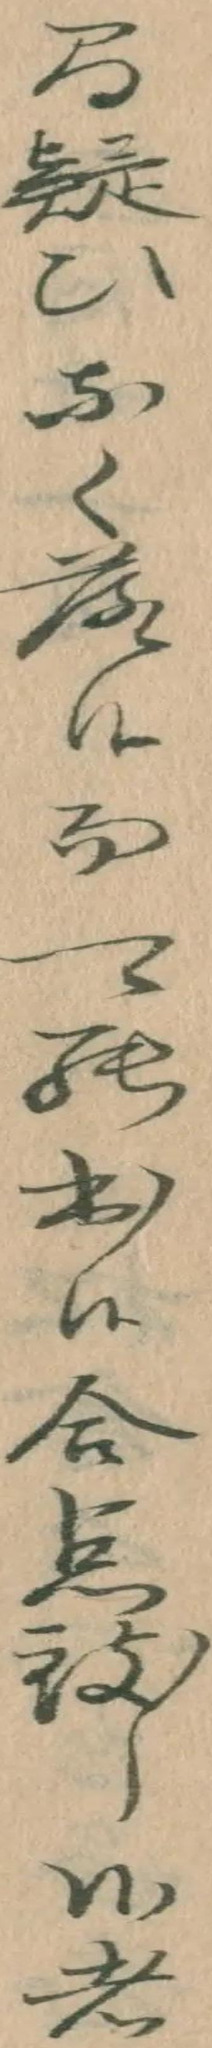間疑ひなく落而候而罷出候合点致し候者
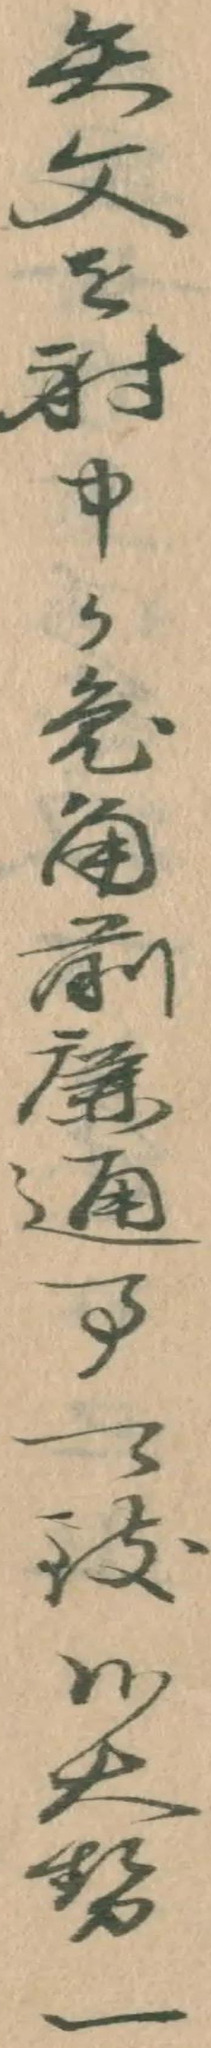矢文を射申か兎角前廉通事可致候大勢一
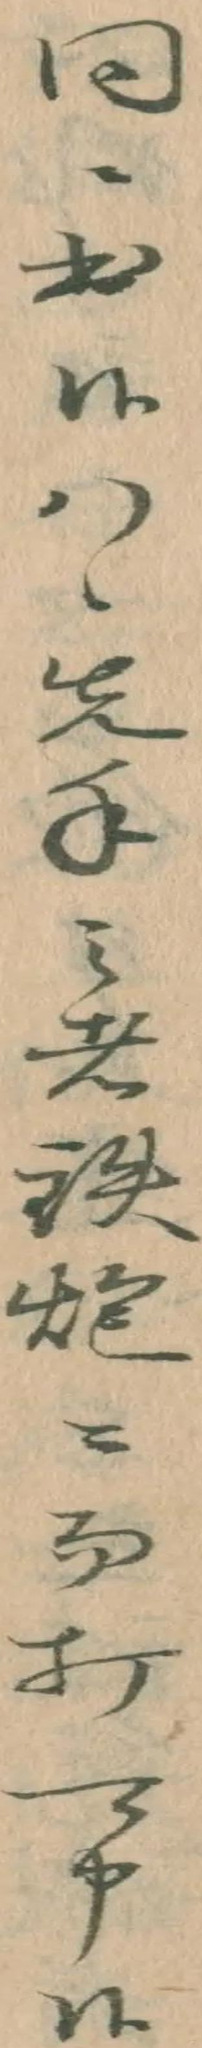同に出候はゝ先手之者鉄炮に而打可申候
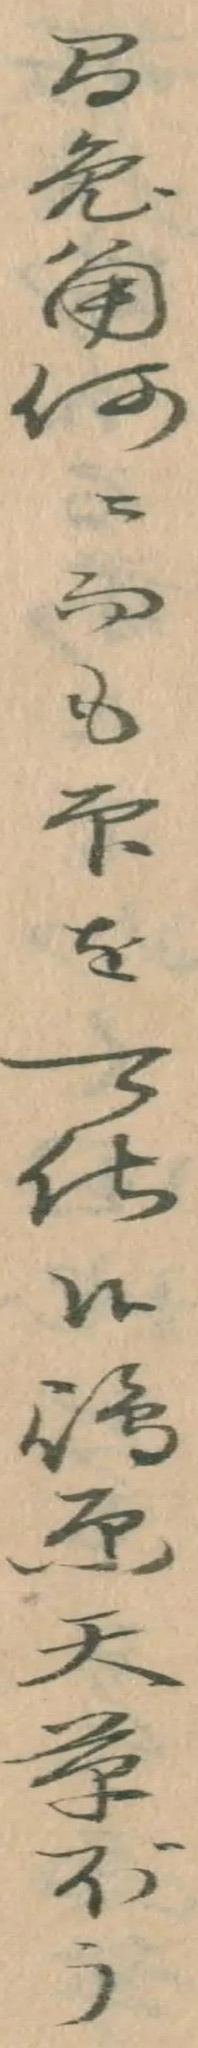間兎角何に而も印を可仕候島原天草不う

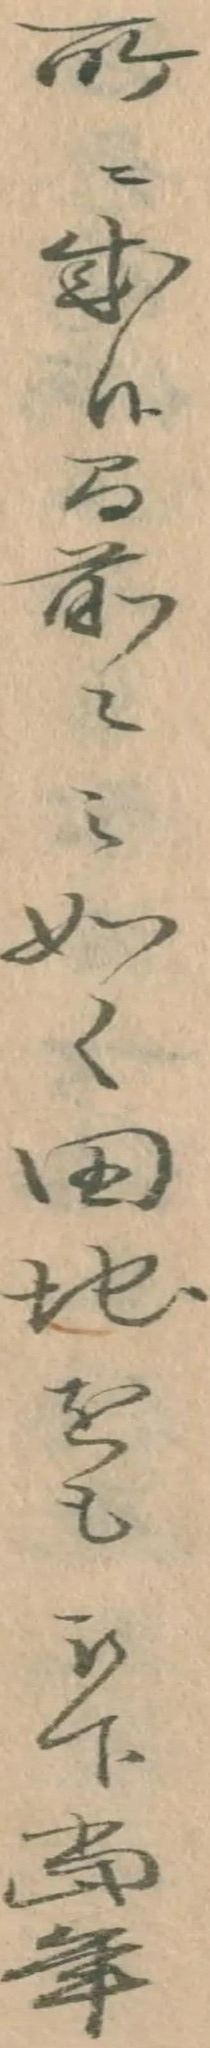所に成候間前々之如く田地をも被下当年
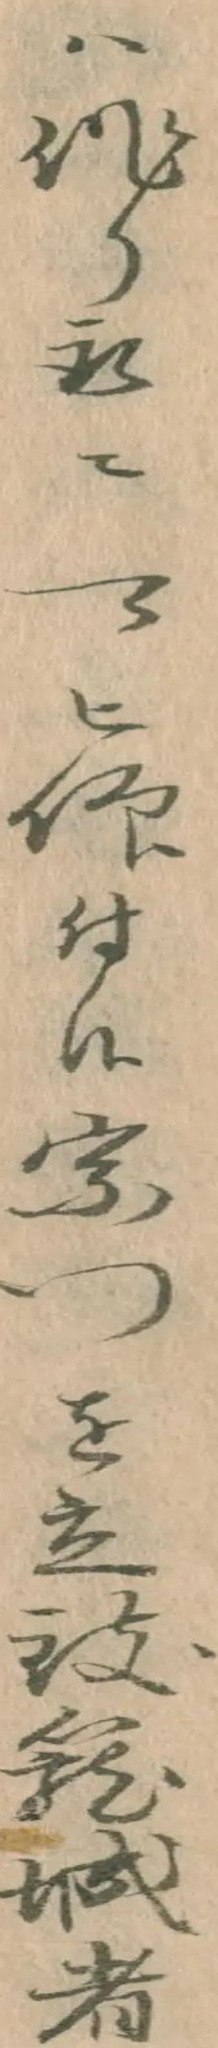は作り取に可被仰付候宗門を立致籠城者
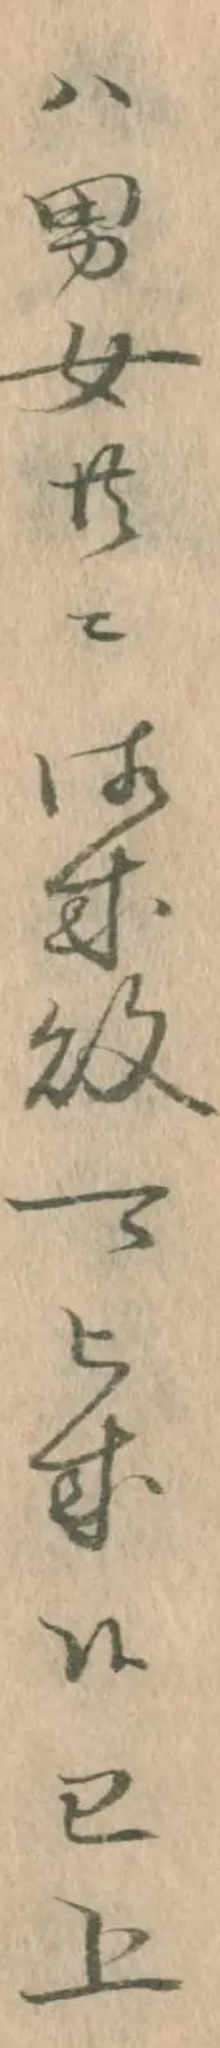は男女共に御成敗可被成候已上
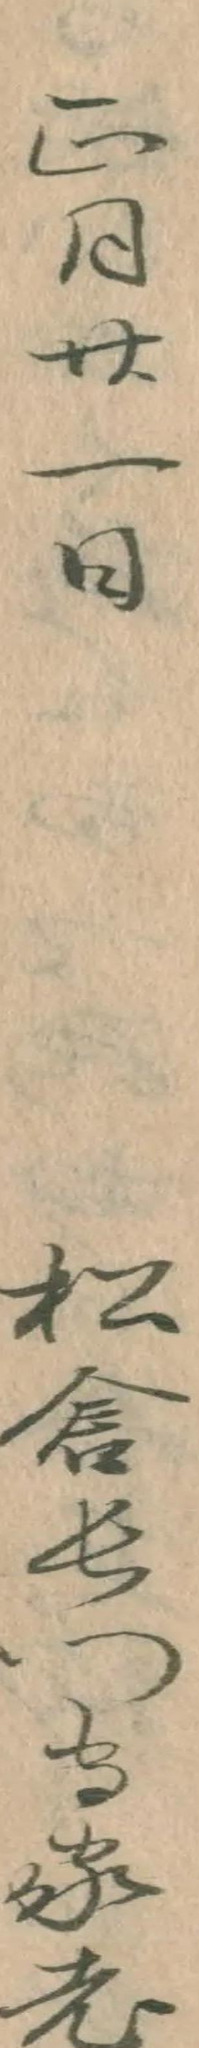正月廿一日松倉長門守家老
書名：切支丹御退治記 49巻. [6]
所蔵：国立国会図書館 National Diet Library, JAPAN
